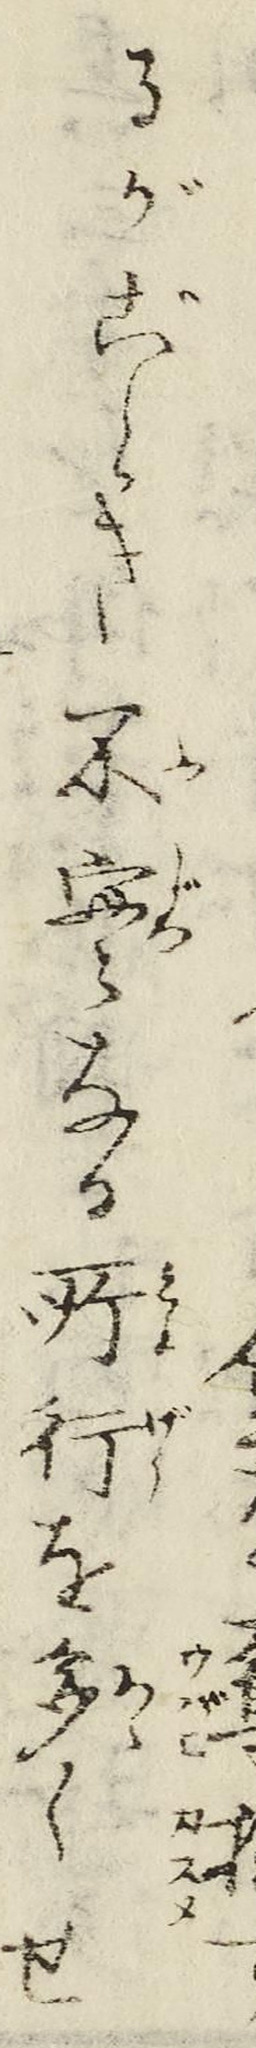るがごとき不実なる所行を多くせ
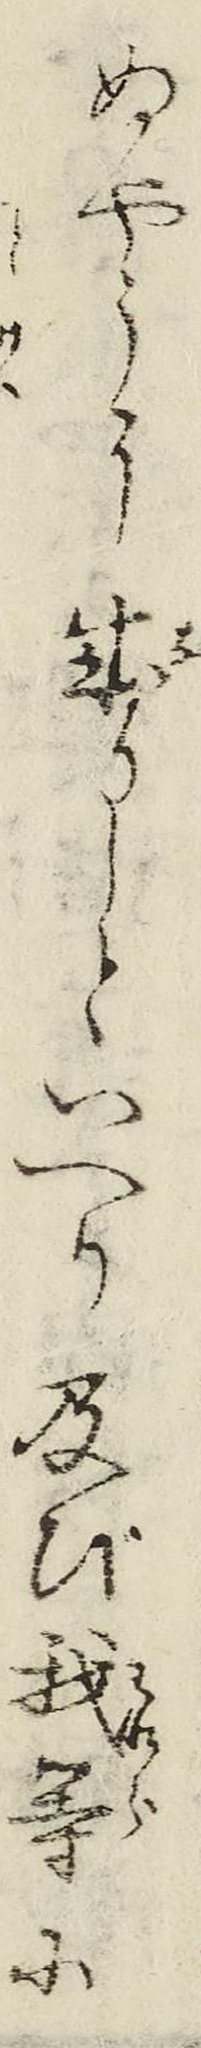ぬやうに成りしといへり及び我等に
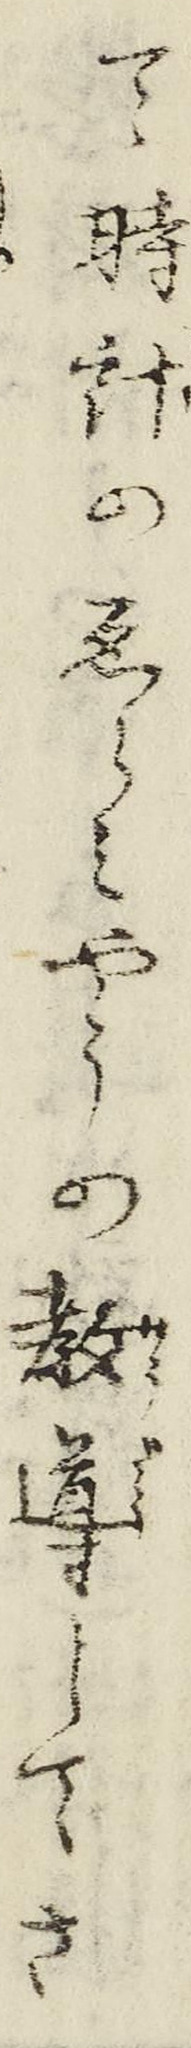て時計のゑらみやうの教導してさ
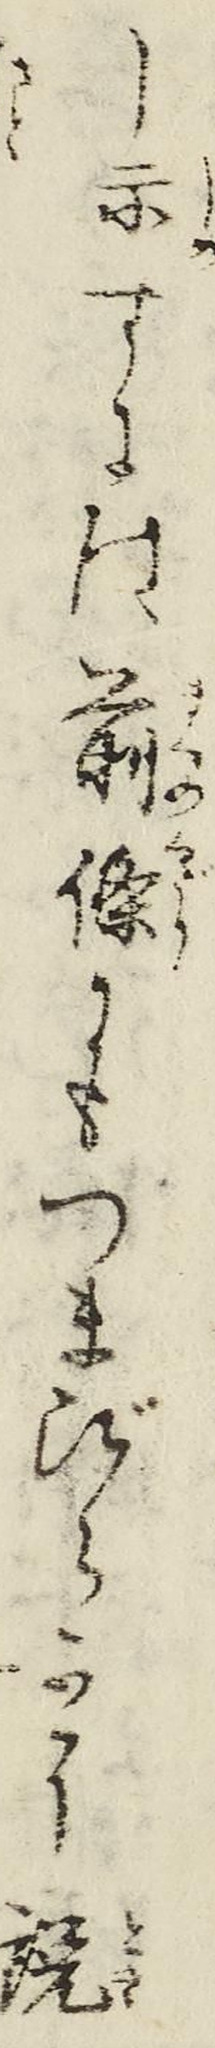し示すには前條にもつまびらかに説
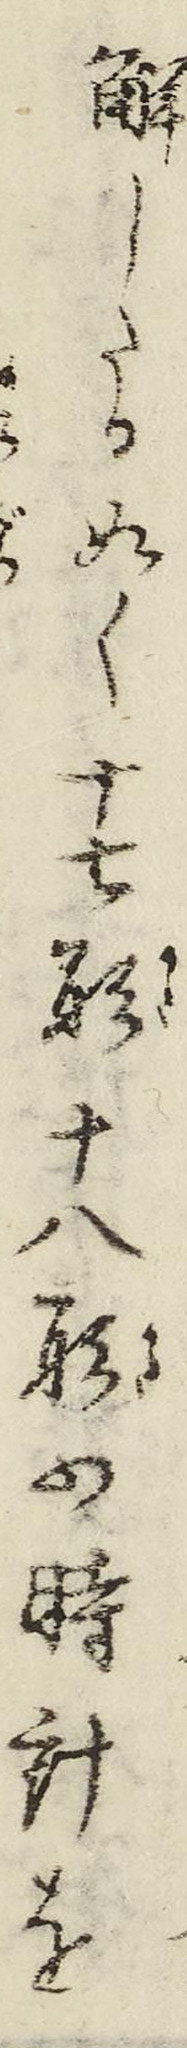解したる如く十七形十八形の時計を
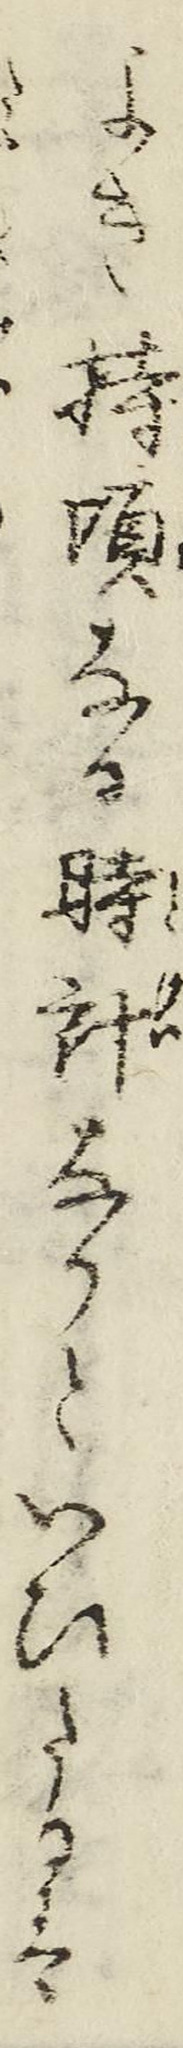よき持頃なる時計なりといひたるは
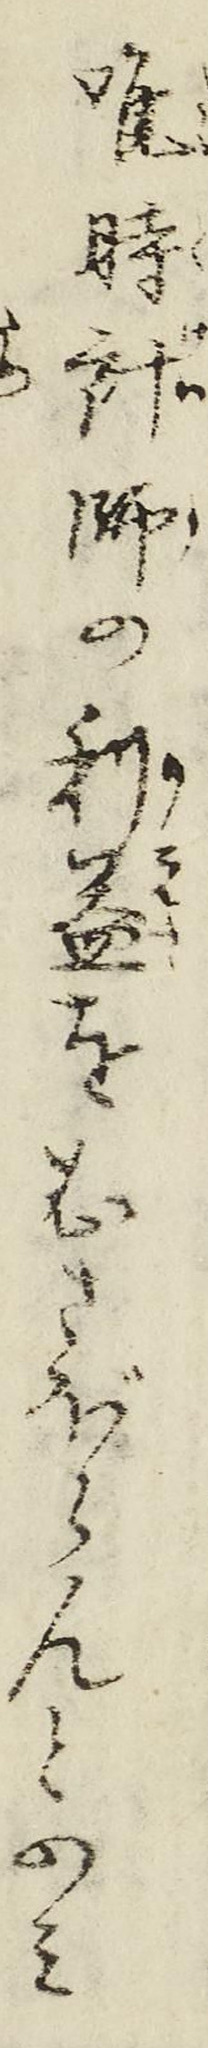唯時計師の利益をむさぼらんとのみ
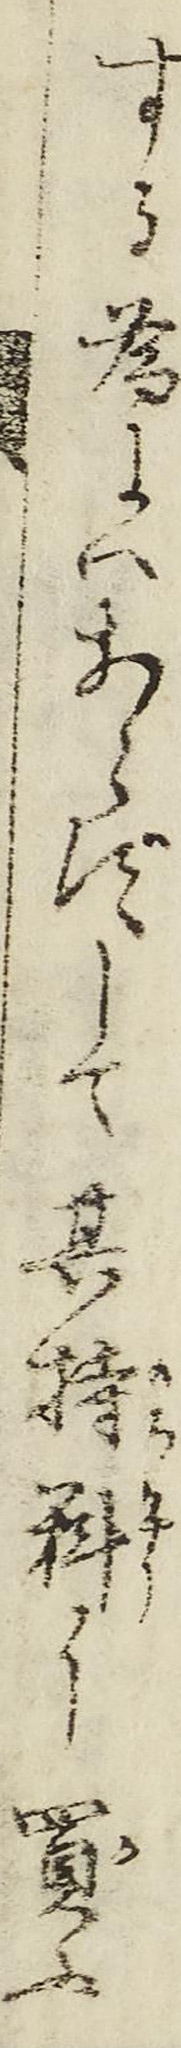する為にはあらずして其持料に買ふ

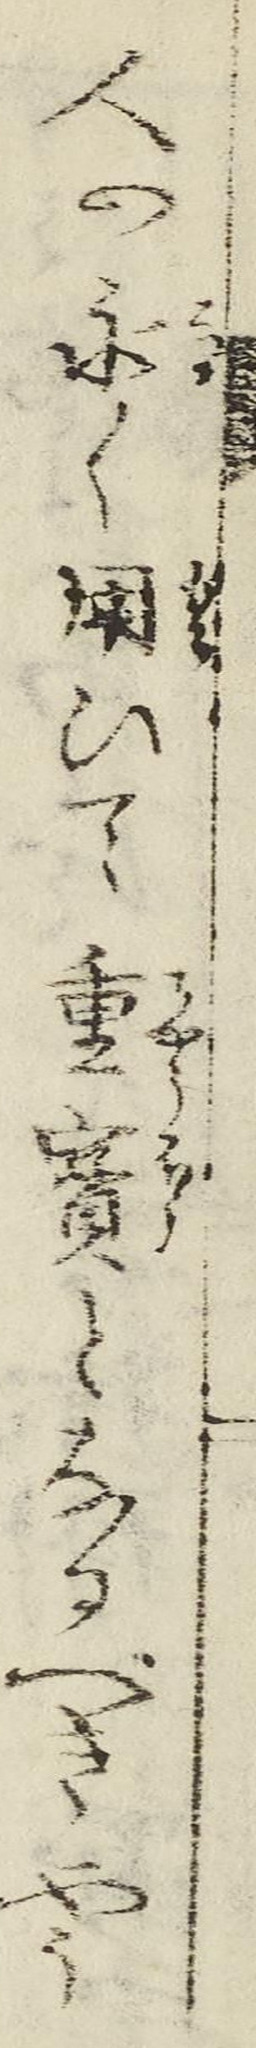人の永く用ひて重宝となるべきやう
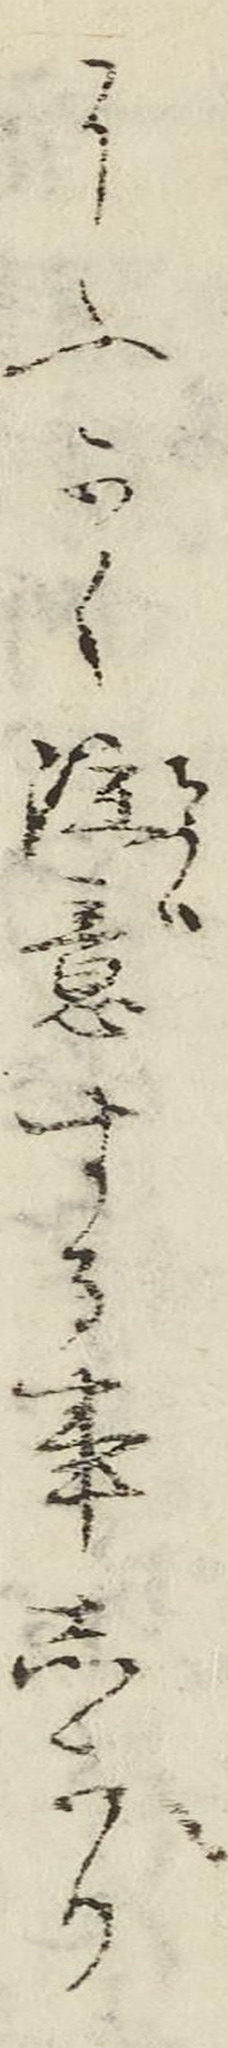にふかく注意する事しかり
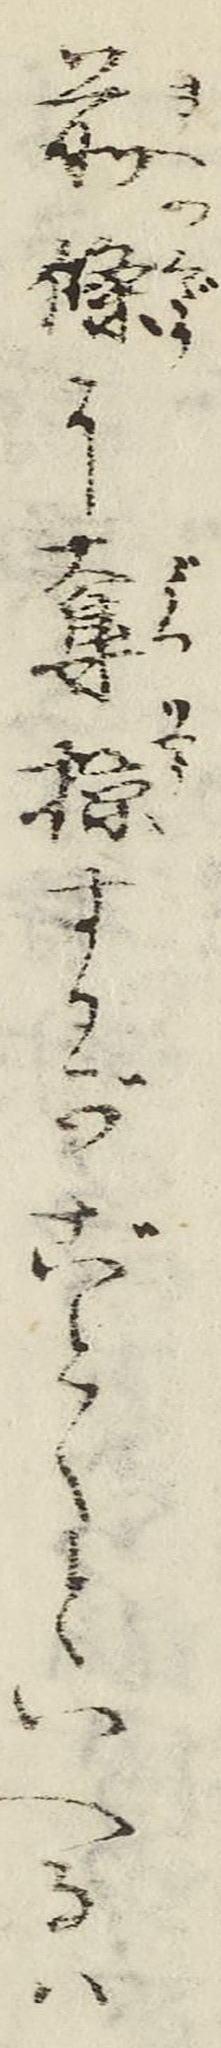前條に奪掠するがごとしといへるは
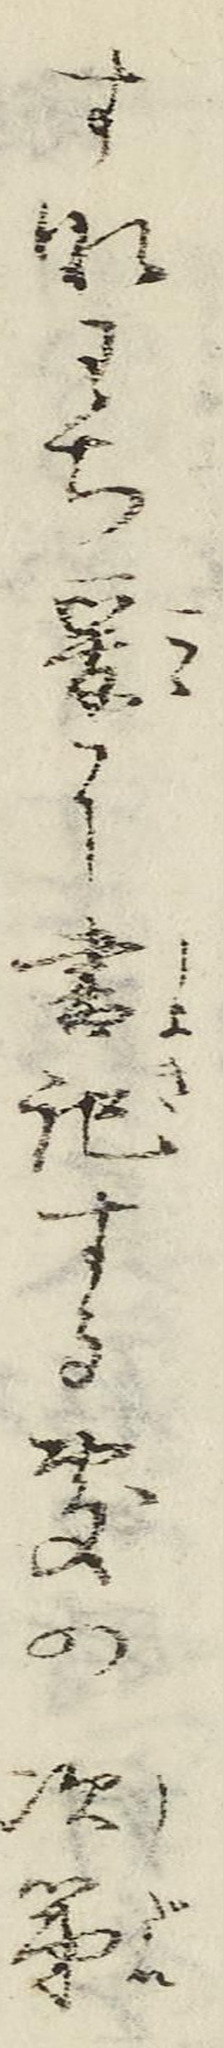すなわち爰に書記する処の次第
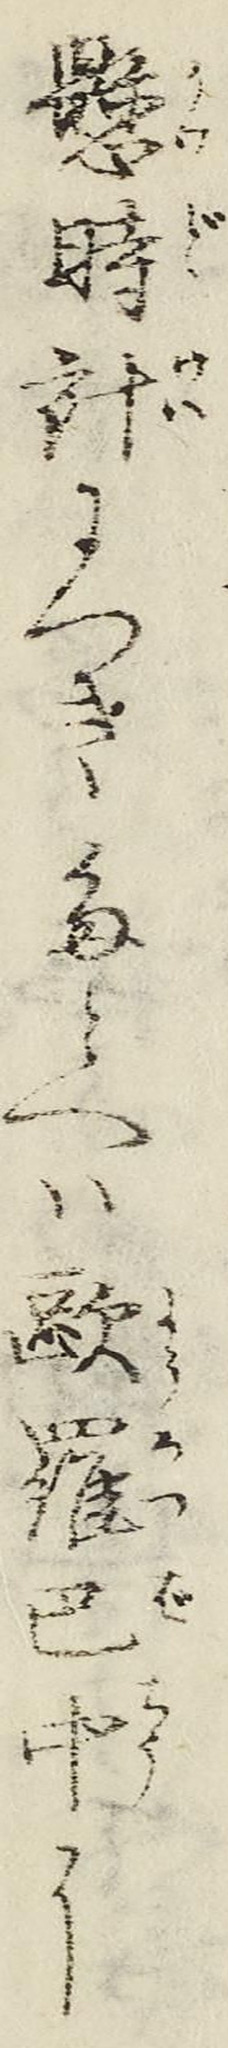懸時計につきたとへは欧羅巴中に
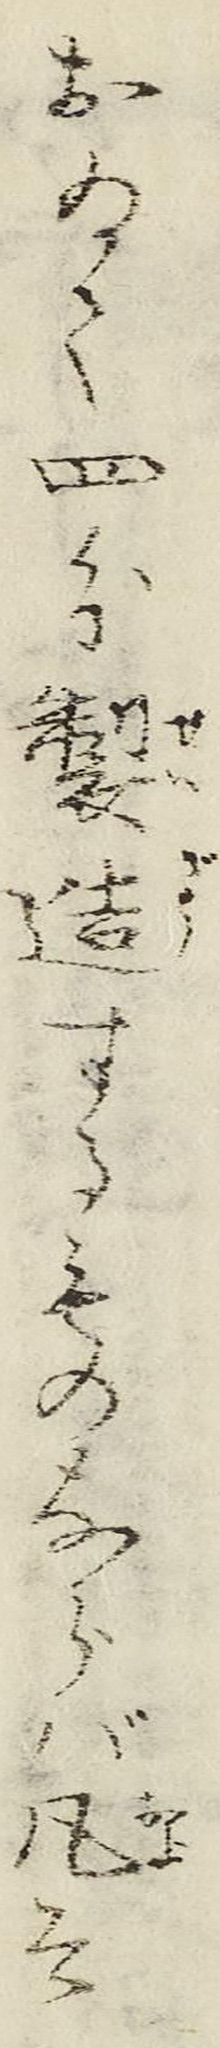おゐて四分製造するものならば凡そ
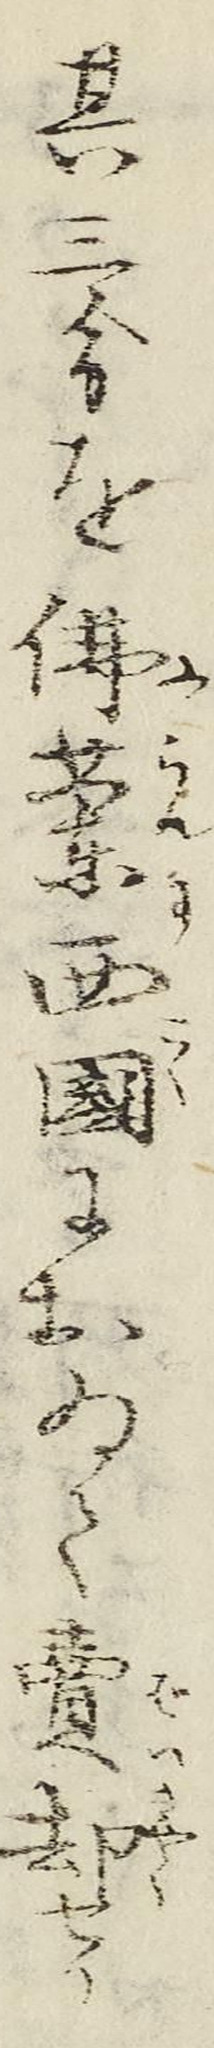其三分を佛蘭西国において売却せり
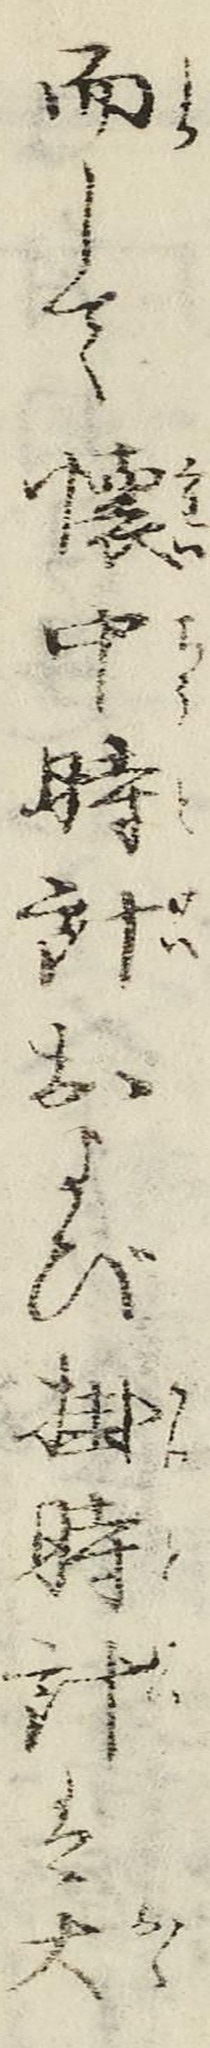而して懐中時計および掛時計は大
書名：[時計に関する冊子]
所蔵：東京大学地震研究所図書室 Earthquake Research Institute Library, The University of Tokyo, JAPAN
